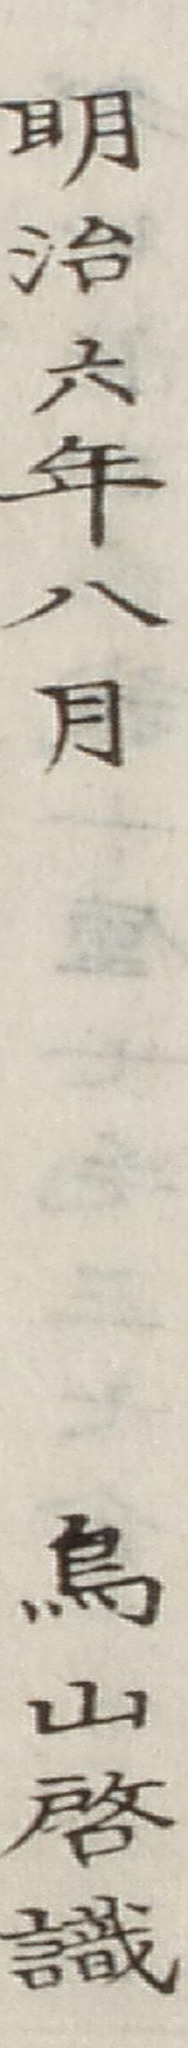明治六年八月鳥山啓識
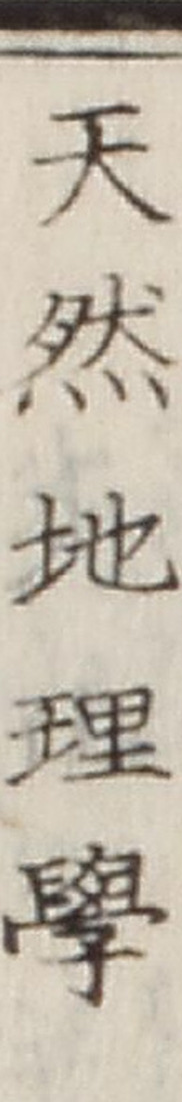天然地理学
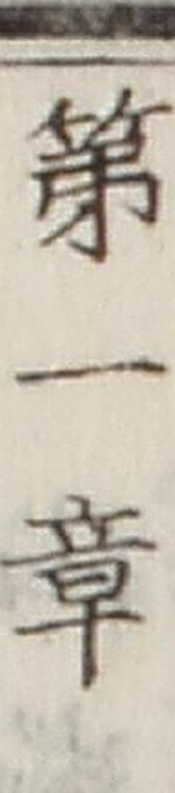第一章
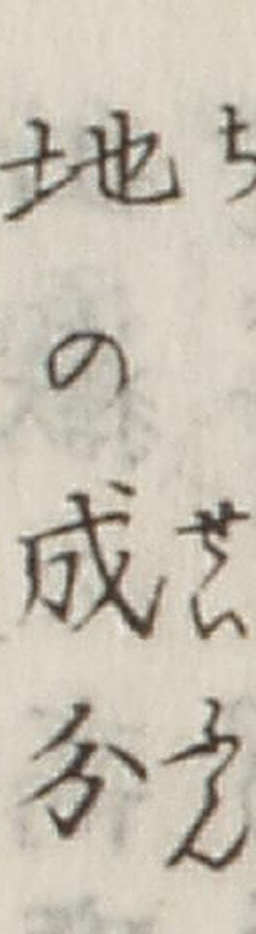地の成分
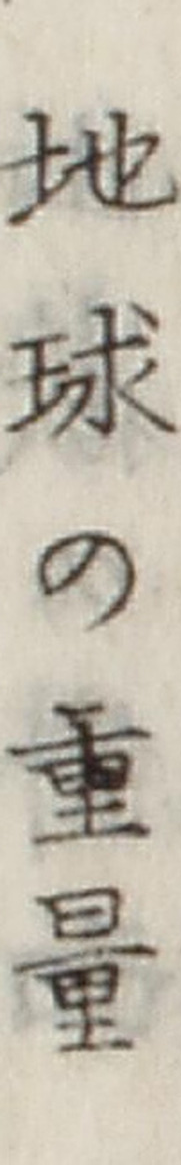地球の重量
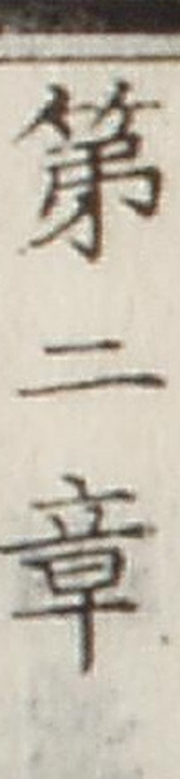第二章
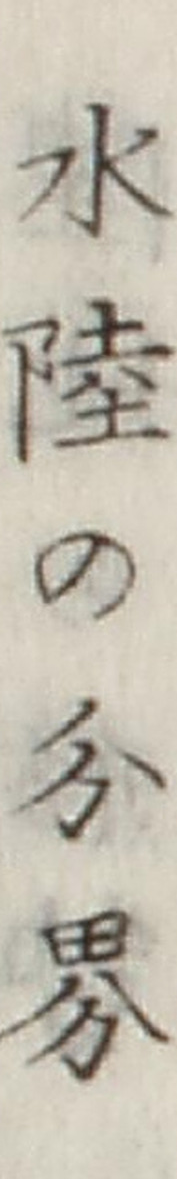水陸の分界
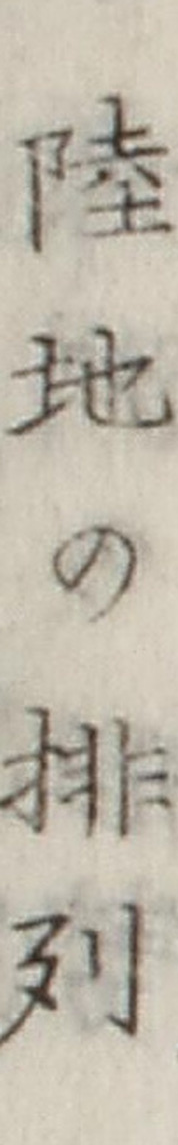陸地の排列

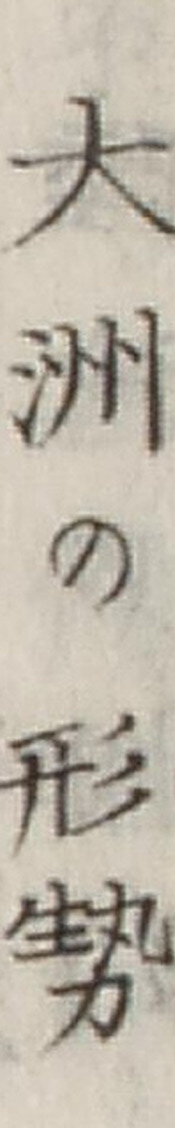大洲の形勢
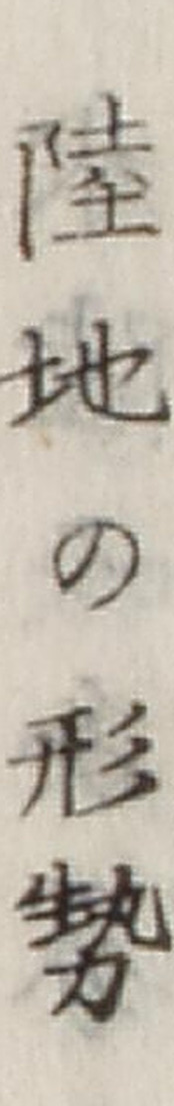陸地の形勢
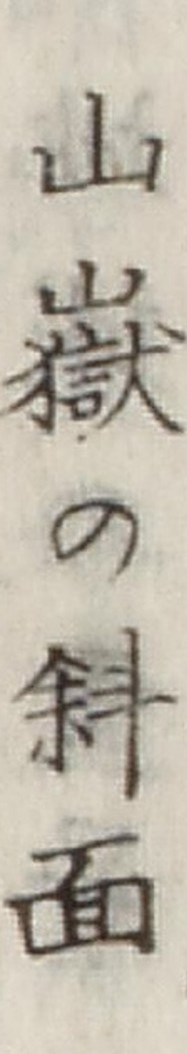山岳の斜面
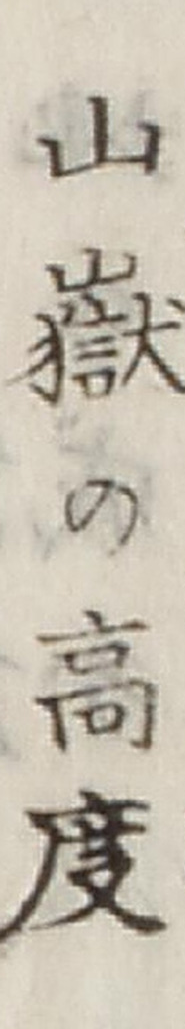山岳の高度
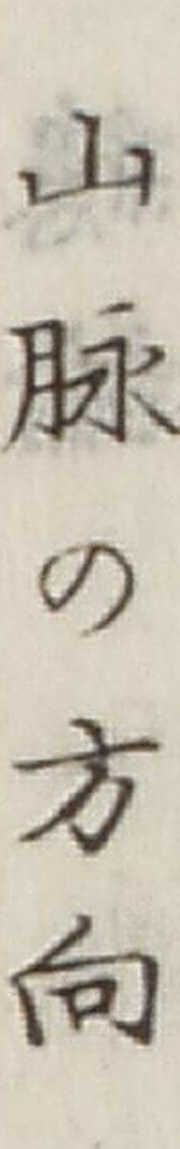山脈の方向
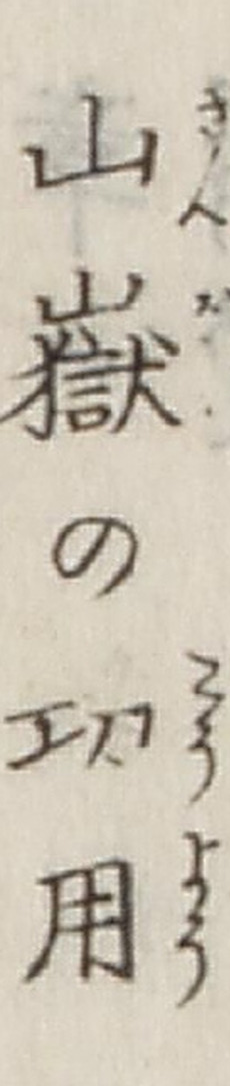山岳の功用
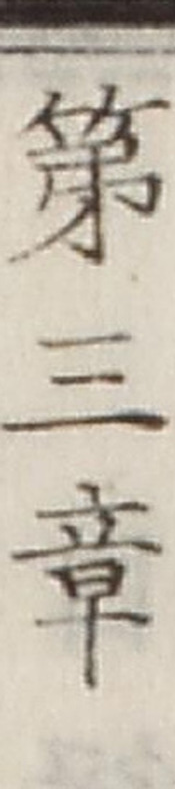第三章
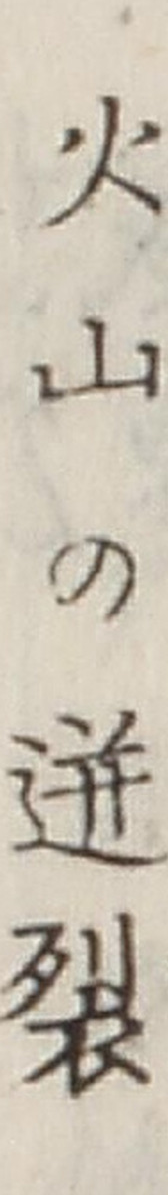火山の迸裂
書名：訓蒙　天然地理學　上
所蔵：東京大学地震研究所図書室 Earthquake Research Institute Library, The University of Tokyo, JAPAN
